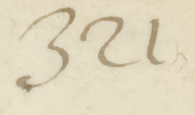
321
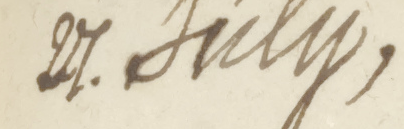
27. Julij,
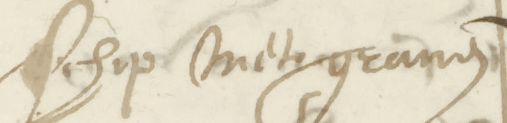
Schip met granen
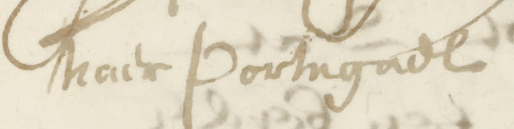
naer Portugael
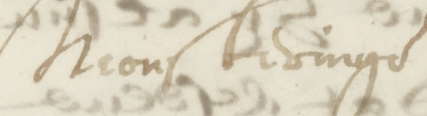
monsteringe
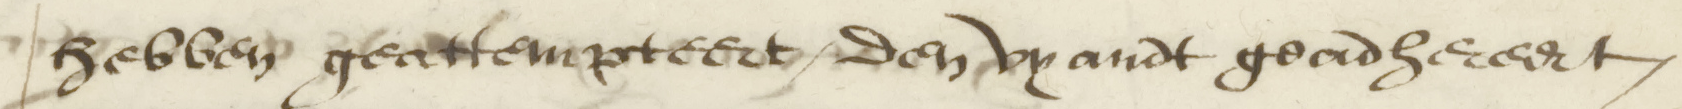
hebben geattempteert, den vyandt geadhereert,
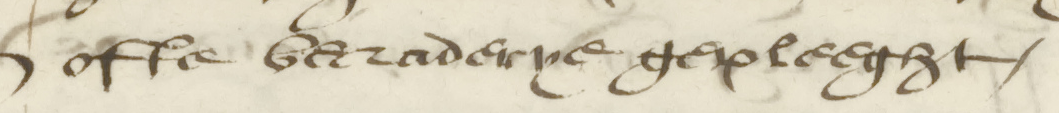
ofte verraderye gepleeght.
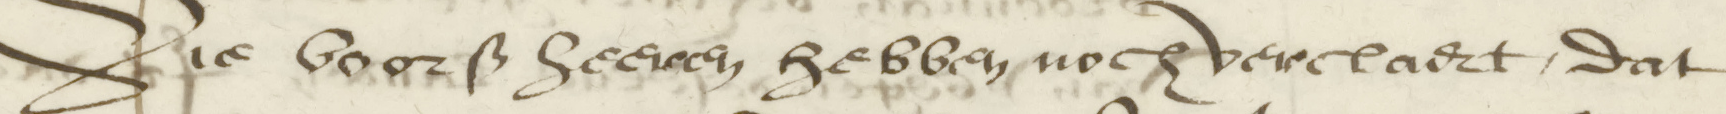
Die voorsz heeren hebben noch verclaert, dat
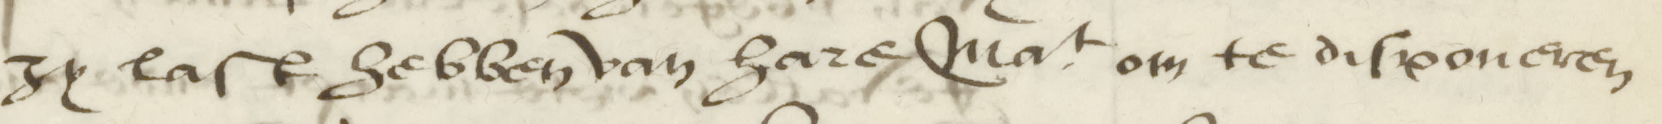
zy last hebben van hare Mat. om te disponeren
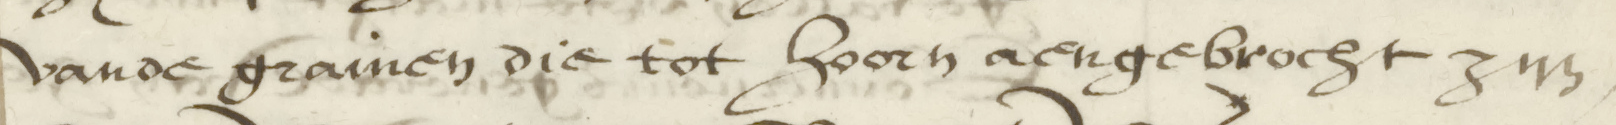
vande grainen die tot Hoorn aengebrocht zijn,
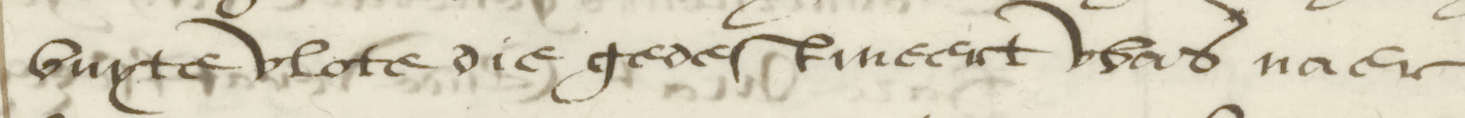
buyte vlote die gedestineert was naer
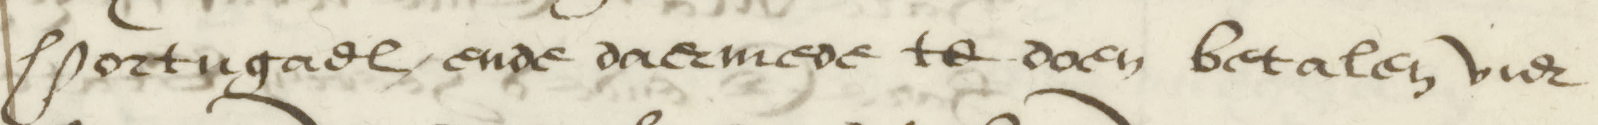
Portugael, ende daermede te doen betalen vier
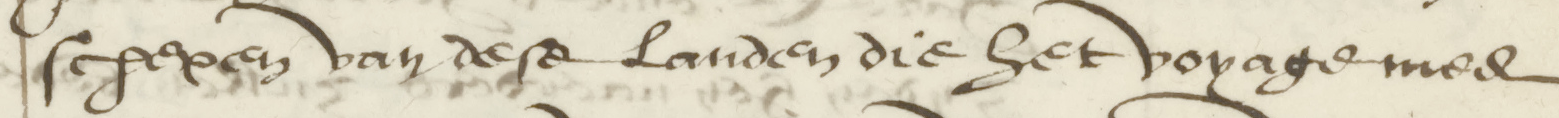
schepen van dese landen die het voyage mede
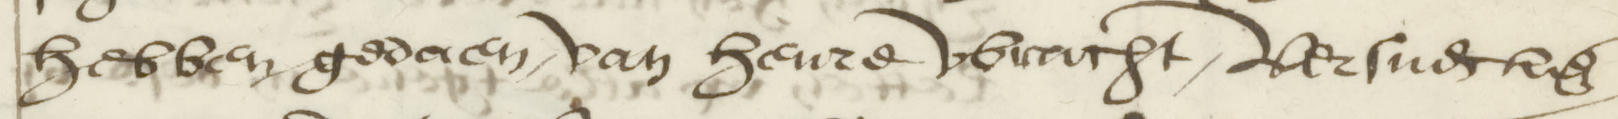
hebben gedaen, van heure wracht, versuecken
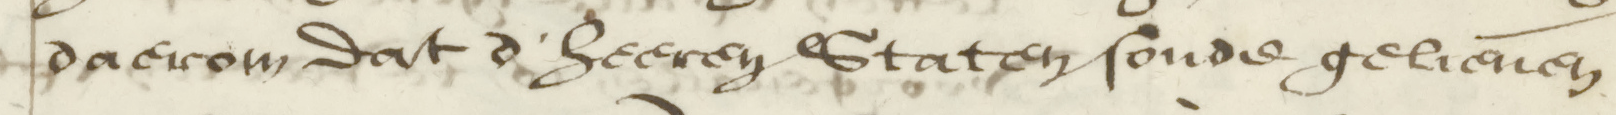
daerom dat d'heeren Staten soude gelieuen
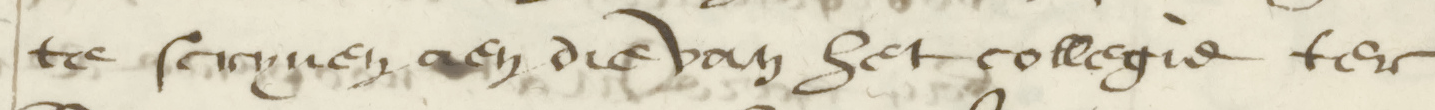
te scryuen aen die van het collegie ter
